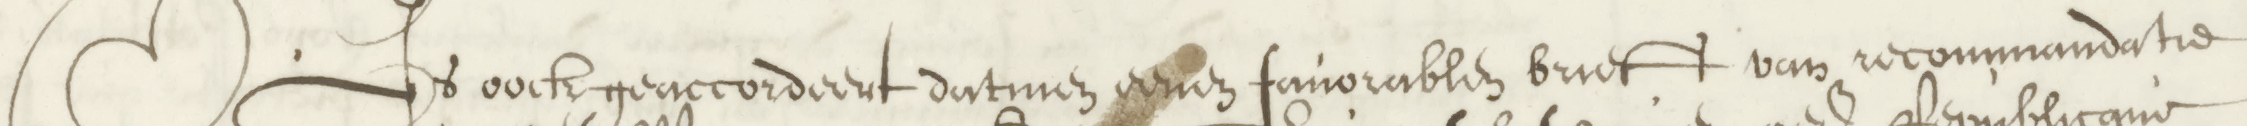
Is oock geacordeert datmen eenen fauorablen brieff van recommandatie
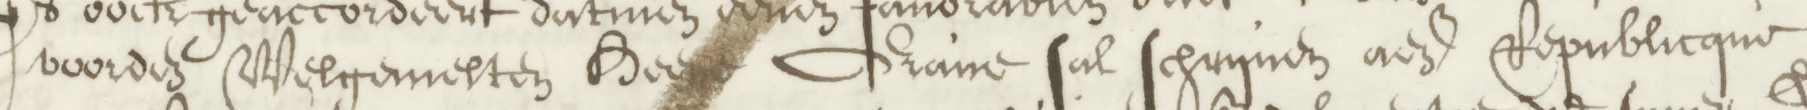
voorden Welgemelten heere Graue sal schryuen aen Republicque
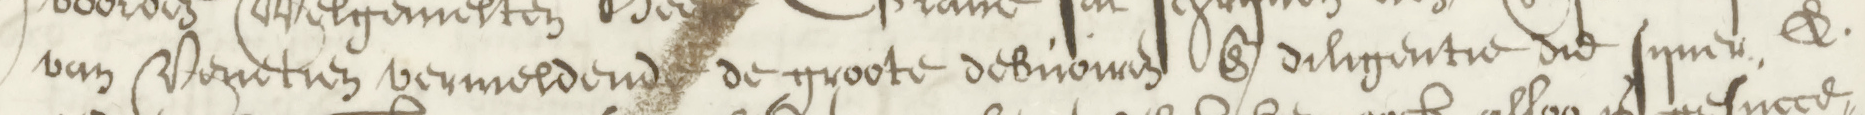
van Venetien vermeldende de groote debuoiren ende diligentie die syner E.
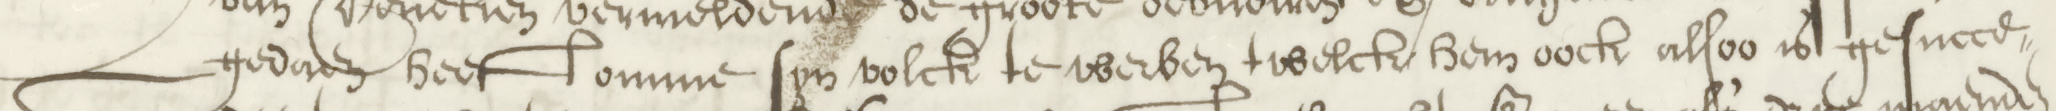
gedaen heeft omme syn volck te werven 'twelck hem oock alsoo is gesucce„
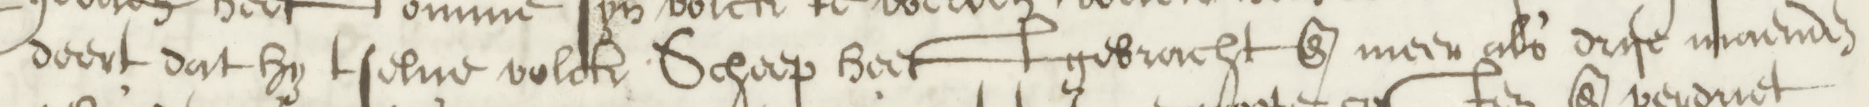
deert dat hy tselue volck Scheep heeft gebracht & meer als drye maenden
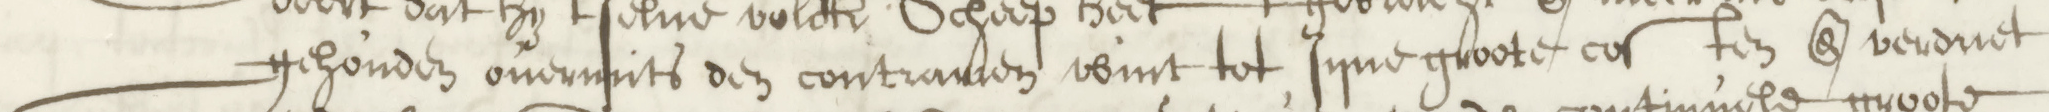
gehouden ouermits den contrairen wint tot syne groote costen & verdriet
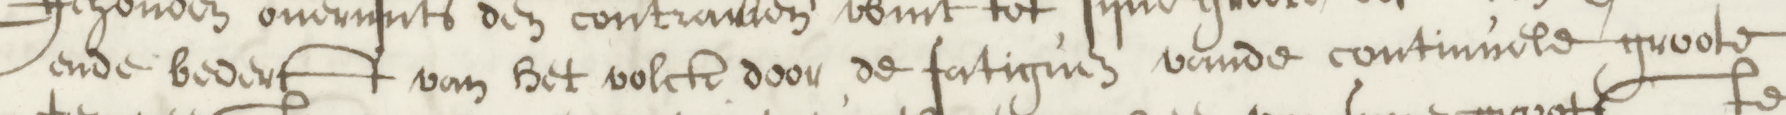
ende bederff van het volck door de fatiguen vande continuele groote
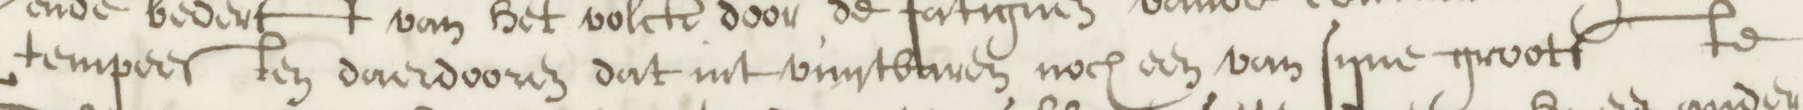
tempeesten daerdooren dat int vuytvaren noch een van syne grootste
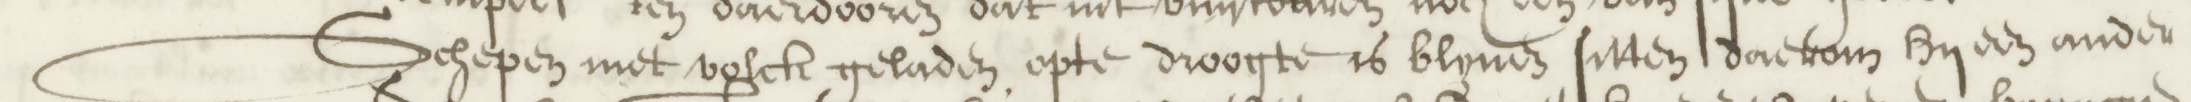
Schepen met volck geladen opte droogte is blyuen sitten daerom hy een ander
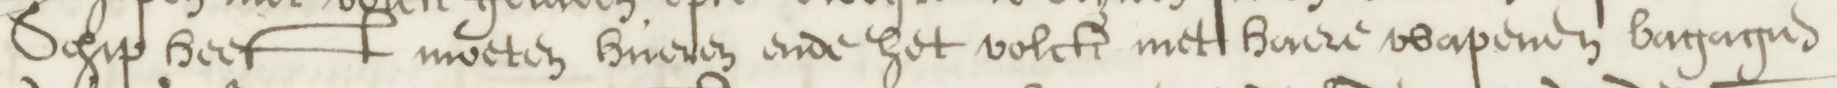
Schip heeft moeten hueren ende het volck met haere wapenen bagagen
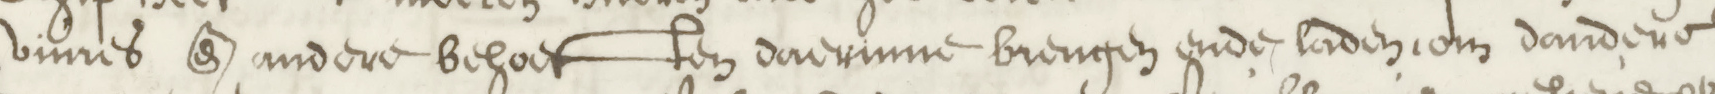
vinres & andere behoeften daerinne brengen ende laden, om dandere
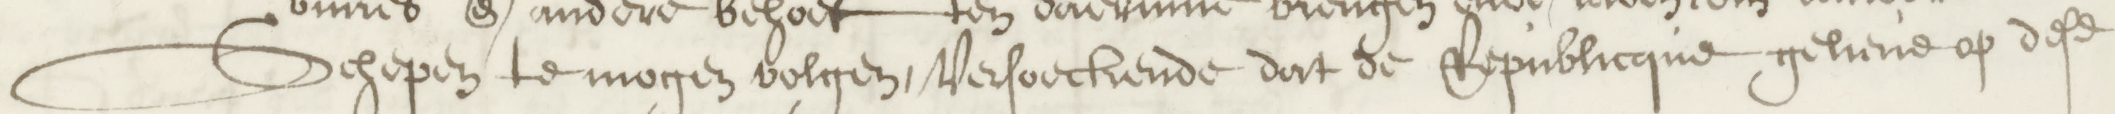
Schepen te mogen volgen. Versoeckende dat de Republicque gelieue op dese
